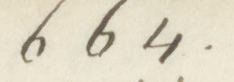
664.
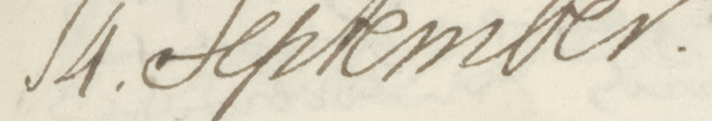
14. September.
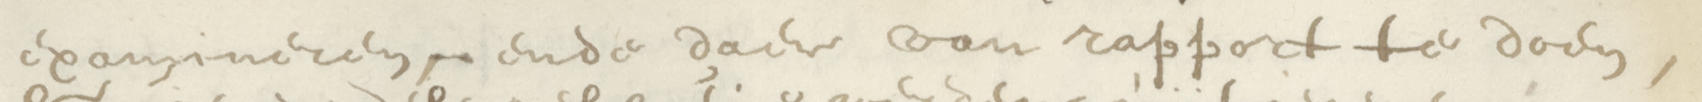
examineren, ende daer van rapport te doen.
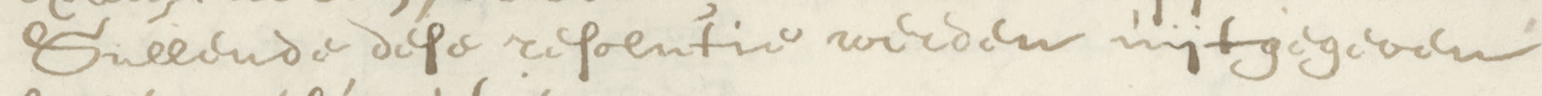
Sullende dese resolutie werden uijtgegeven
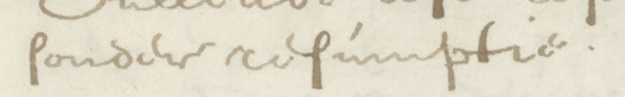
sonder resumptie.
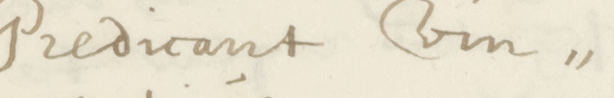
Predicant vin„
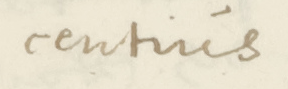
centius
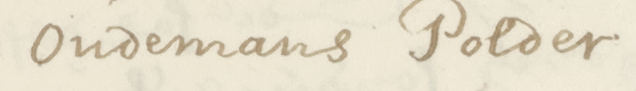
oudemans Polder
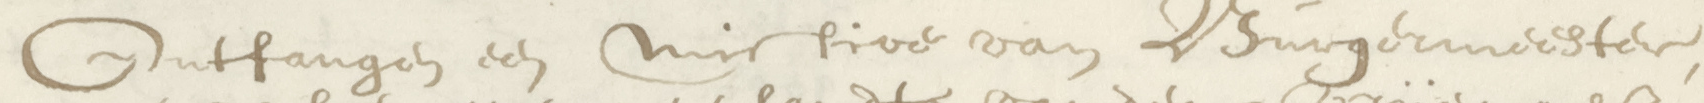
Ontfangen een missive van Burgermeester
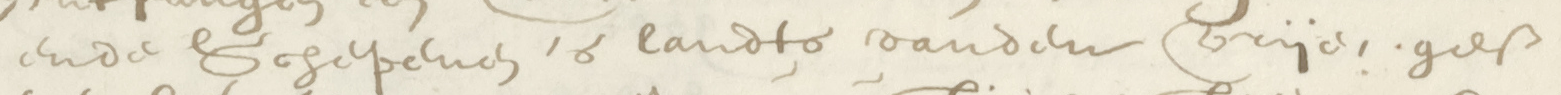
ende Schepenen 's landts vanden vrije, ges
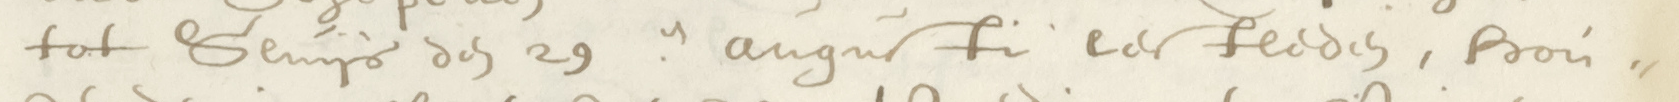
tot Sluijs den 29en augusti lestleden, hou„
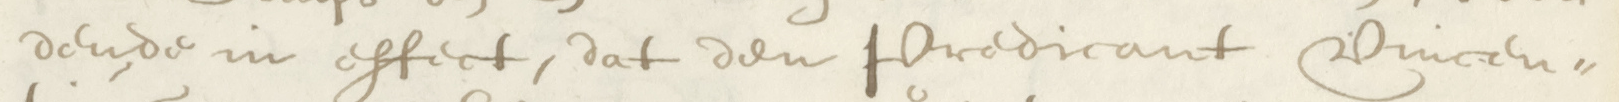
dende in effect, dat den Predicant Vincen„
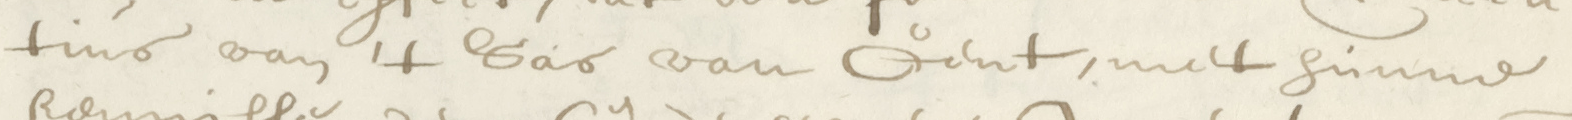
tius van 't Sas van Gent, met hunne
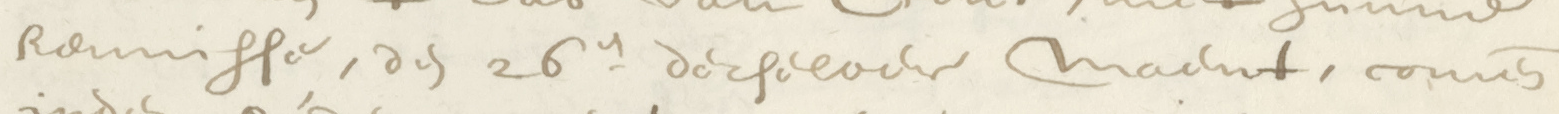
kennisse, den 26en derselver maent, comen
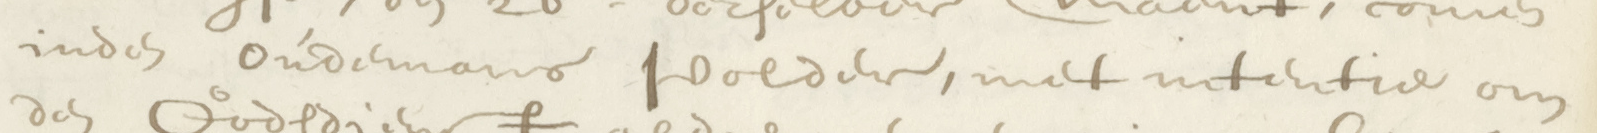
inden oudemans Polder, met intentie om
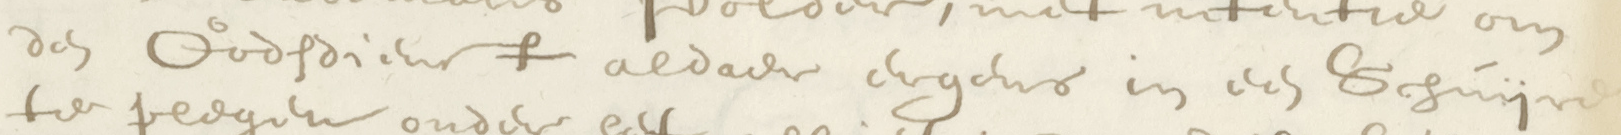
den Godsdienst aldaer ergens in een Schuijr
